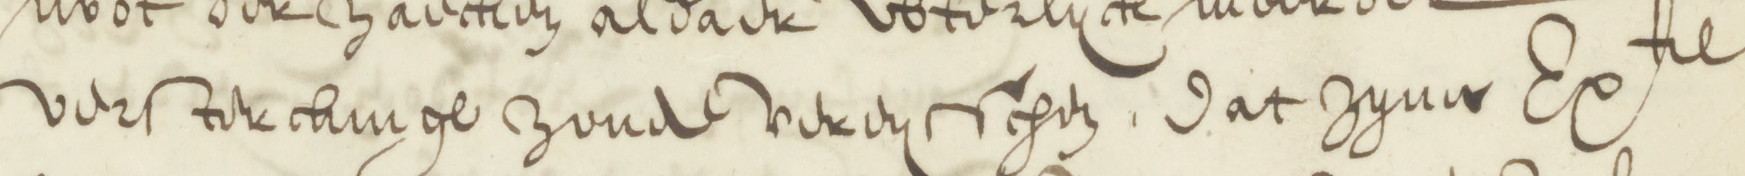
verstreckinge zoude vereysschen, dat zyne Extie
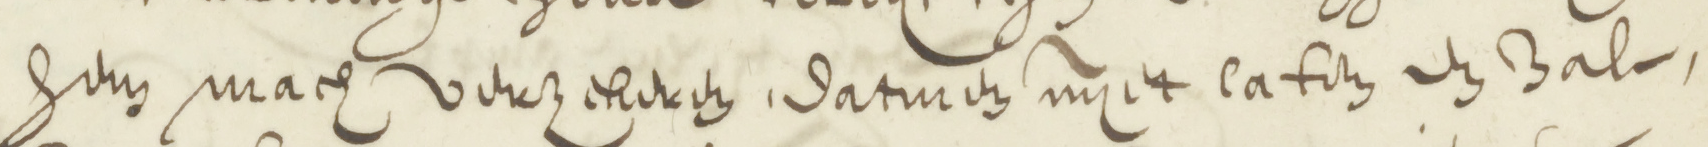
hem mach verzekeren, datmen nyet laten en zal,
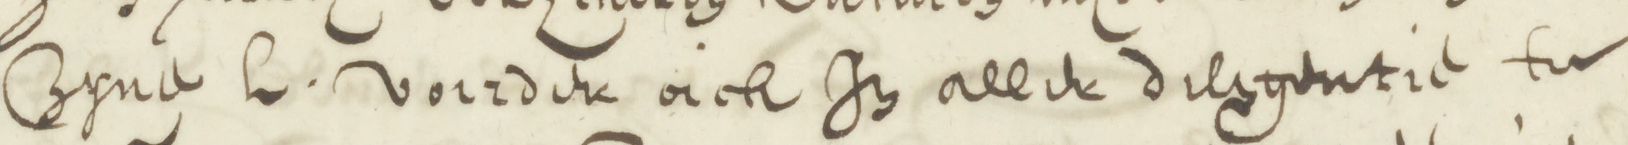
zyne L. voirder oick In aller diligentie te
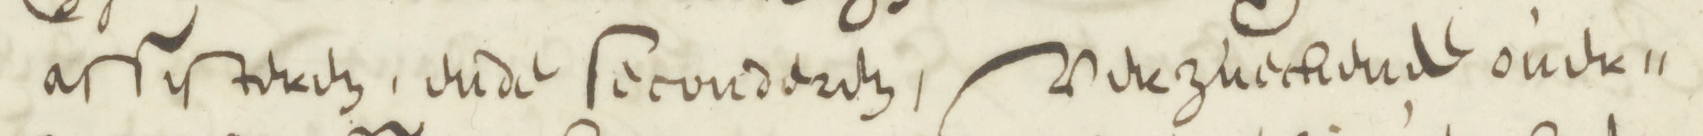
assisteren, ende seconderen, verzueckende ouer„
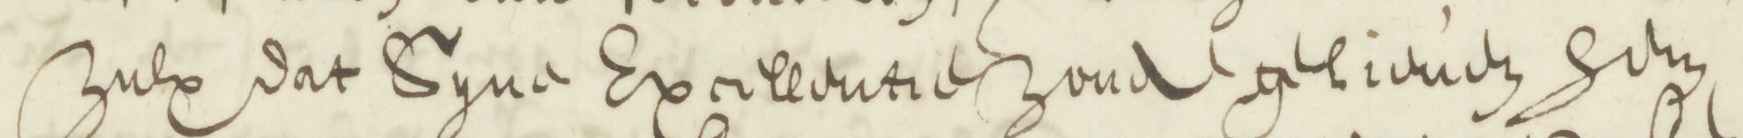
zulx dat Syne Excellentie zoude gelieuen hem
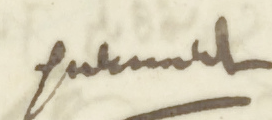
hiermede
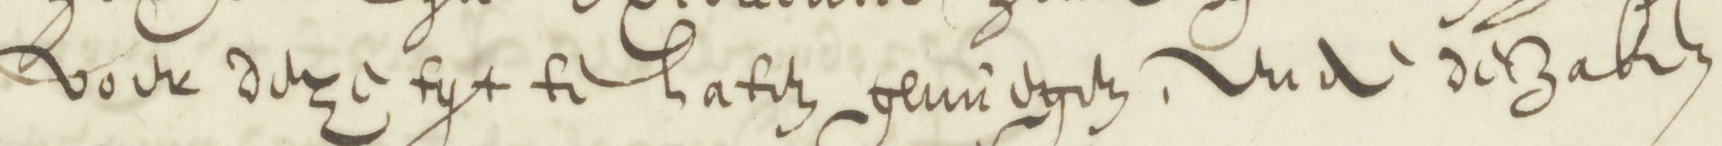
voer deze tyt te laten genuegen, ende de zaken
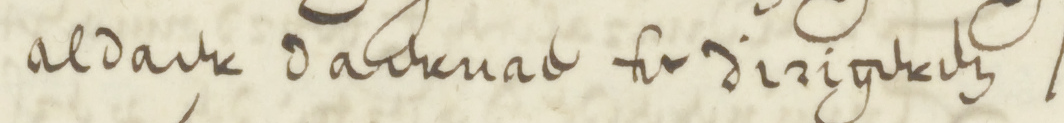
aldaer daernae te dirigeren.
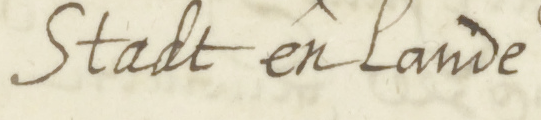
Stadt en Lande
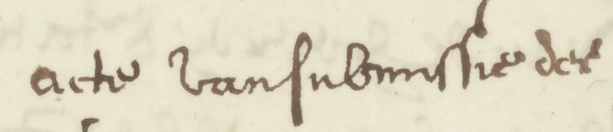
acte van submissie der
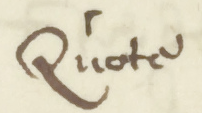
Quote
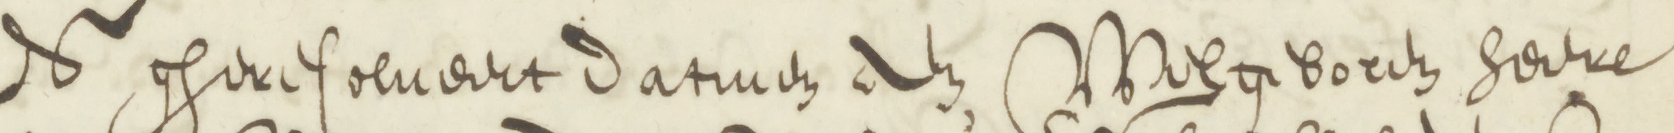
Is gheresolueert datmen den Welgeboren heere
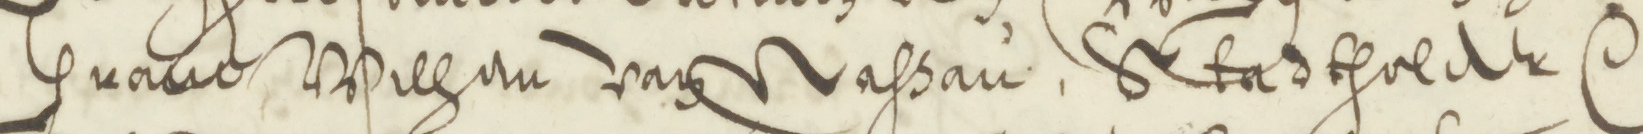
Grave Wilhem van Nassau, Stadtholder ©
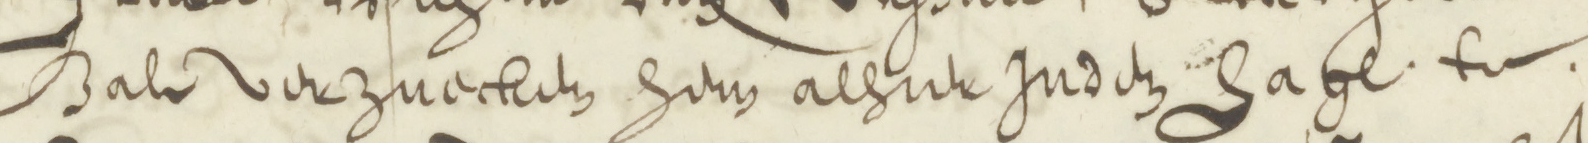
zal verzuecken hem alhier Inden Hage te
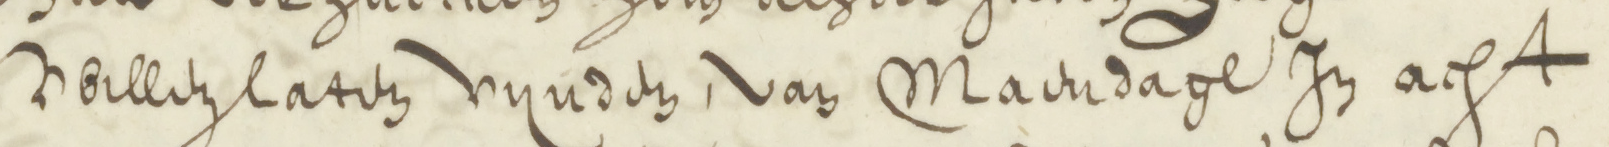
te willen laten vynden, van Maendage in acht
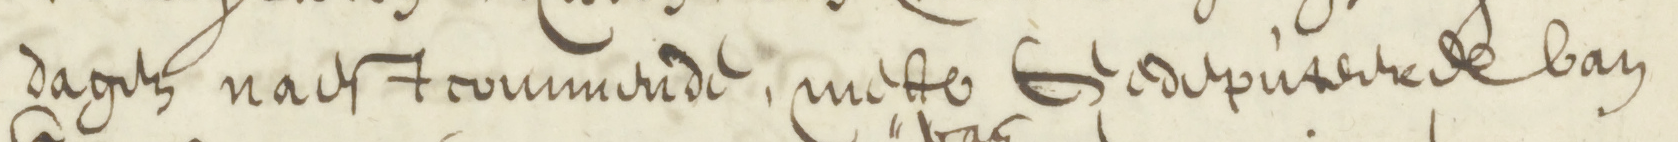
dagen naestcommende, mette Gedeputeerde van
